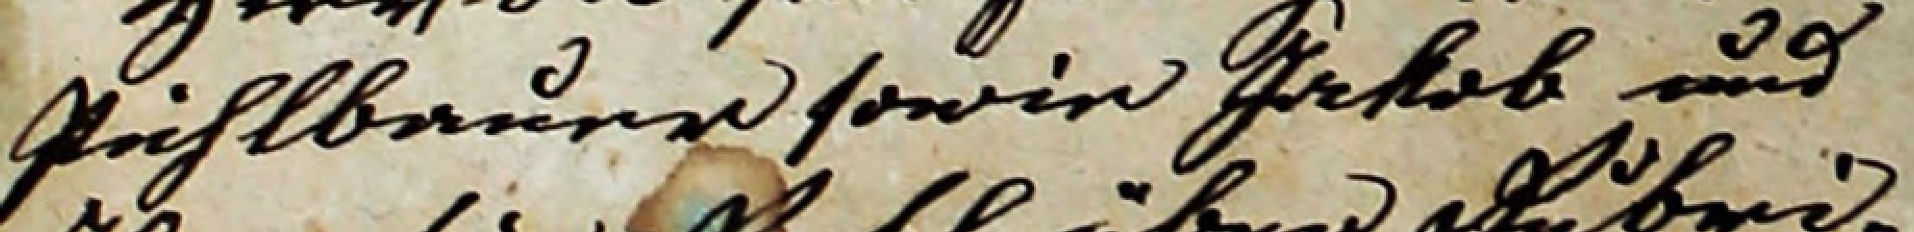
Pichlbauer sowie Jakob und
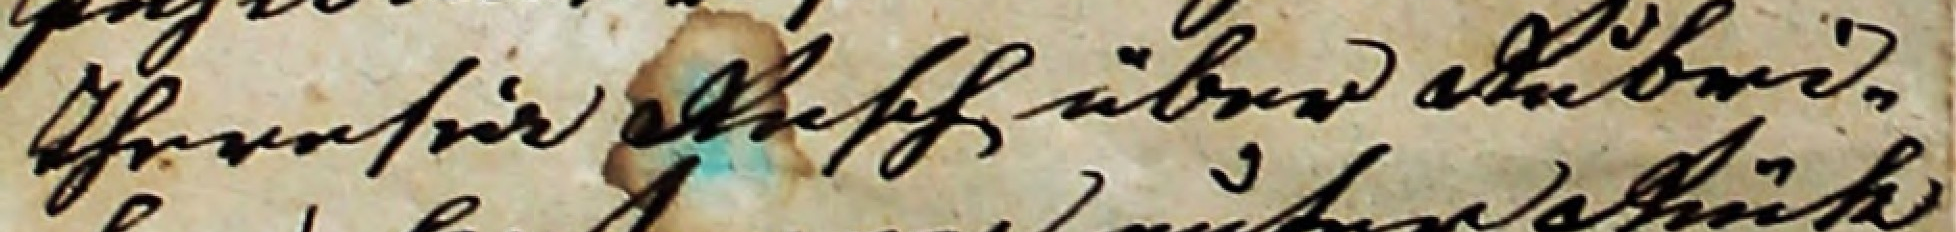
Theresia Resch über Rubri„
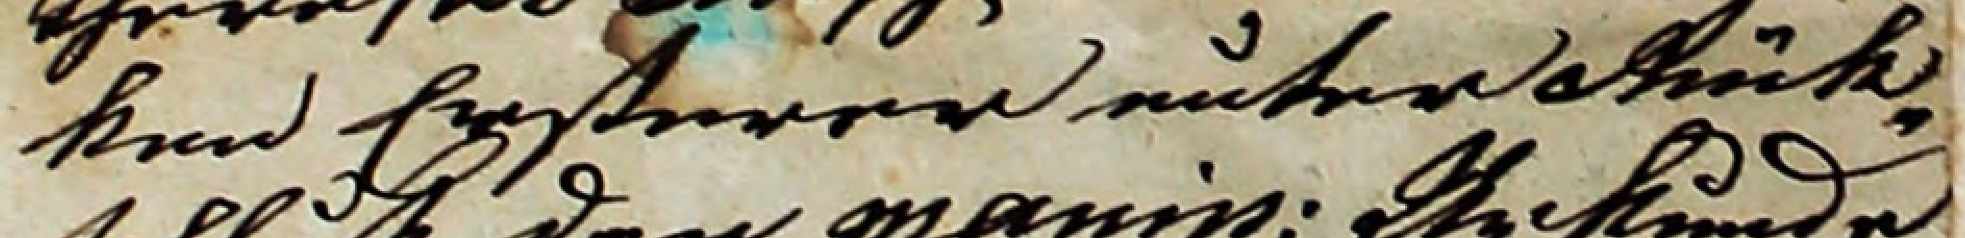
ken Ersterer unter Rück„
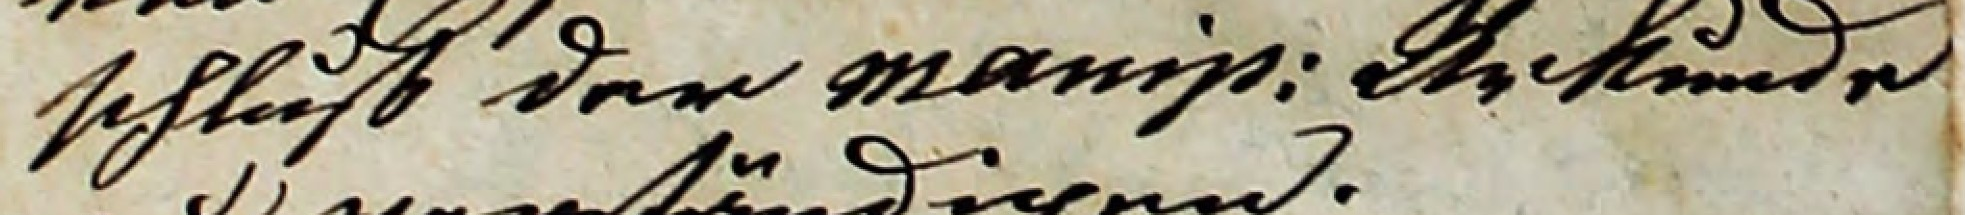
schluss der manip: Urkunde
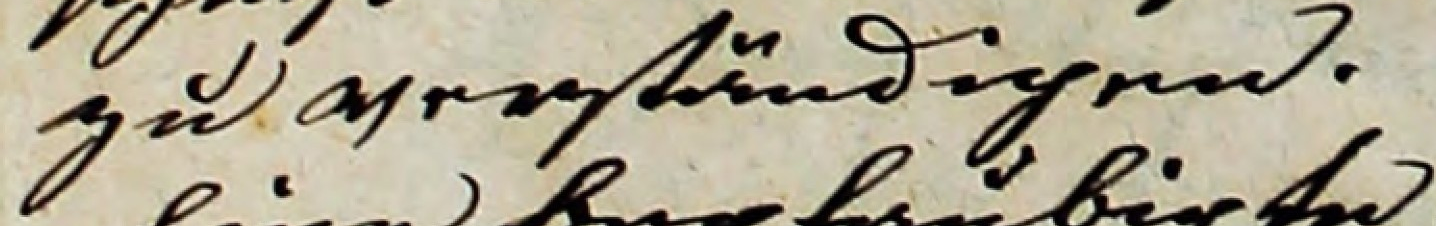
zu verständigen.
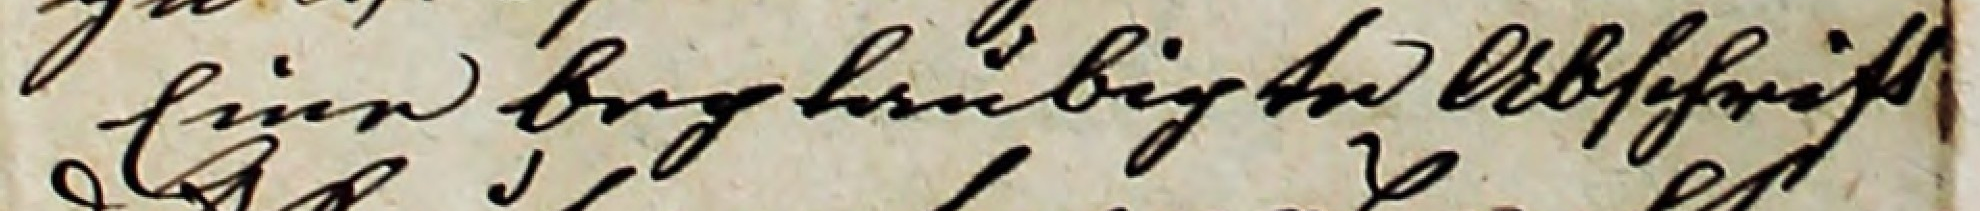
Eine Beglaubigte Abschrift
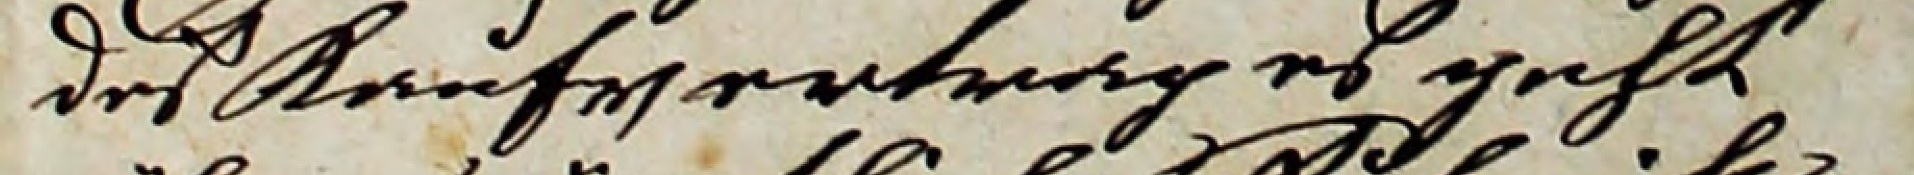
des Kaufvertrages geht
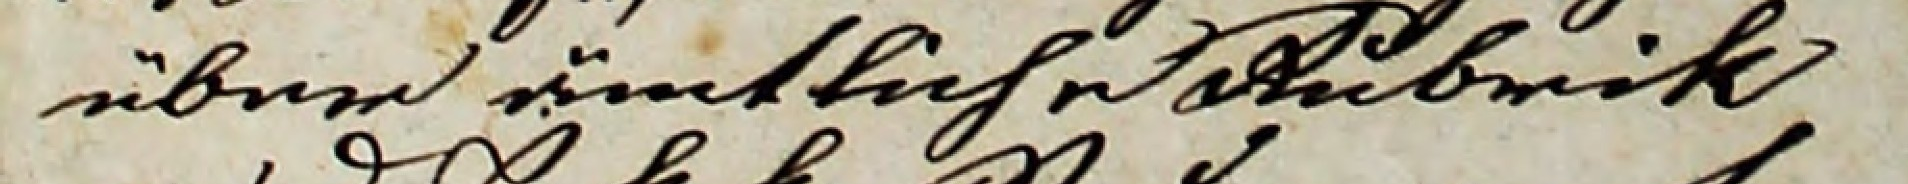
über ämtliche Rubrik
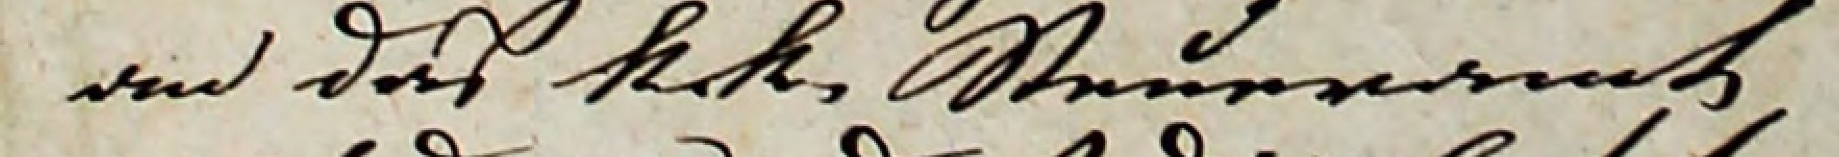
am das k.k. Steueramt
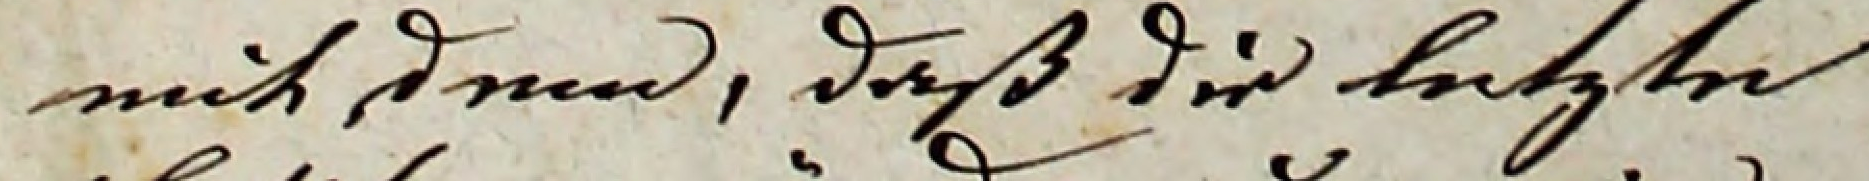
mit dem, daß die letzte
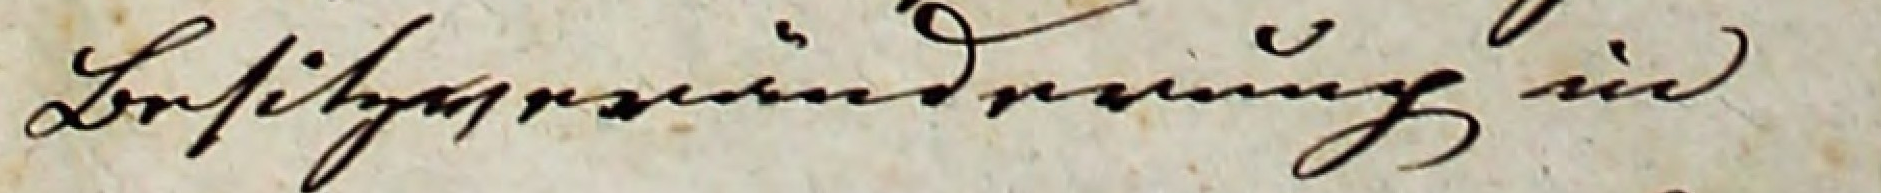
Besitzveränderung in
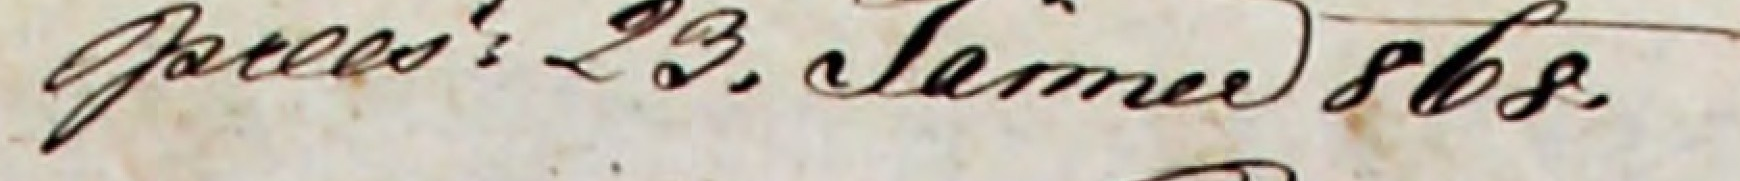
Präs: 23. Jänner 868
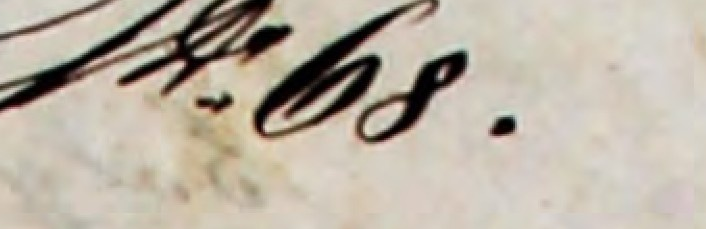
ddo 68.
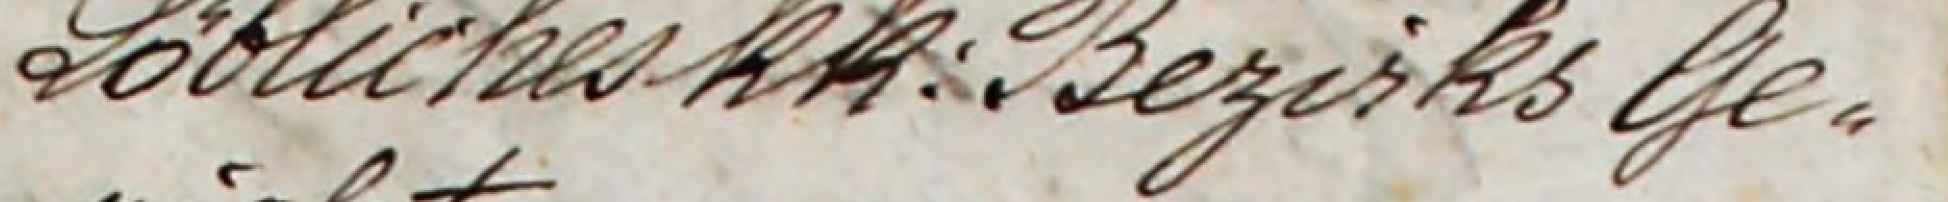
Löbliches kk: Bezirks Ge=
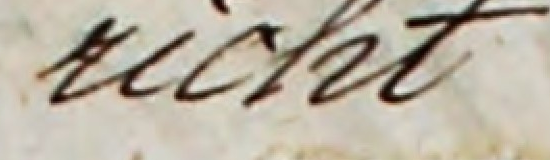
richt
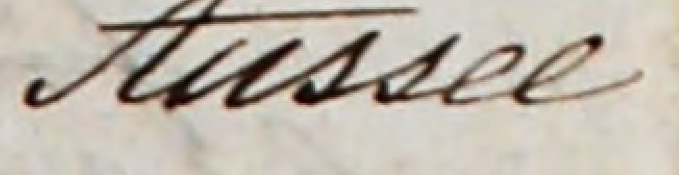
Aussee
